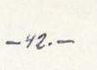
42
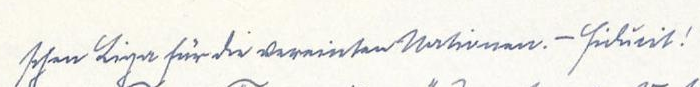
schen Liga für die Vereinten Nationen.- Fiducit!
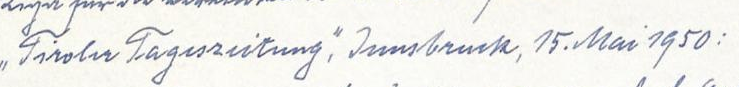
„Tiroler Tageszeitung“, Innsbruck 15. Mai 1950:
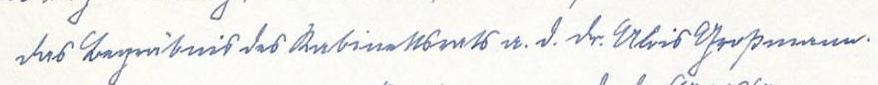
Das Begräbnis des Kabinetts Rat des a. D. Dr. Alois Großmann
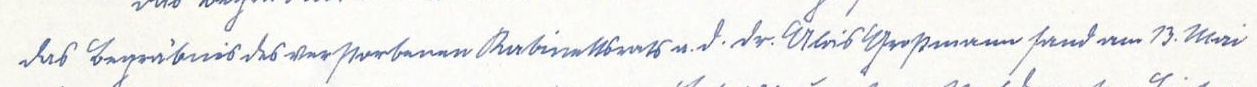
Das Begräbnis des verstorbenen Kabinettsrats a. D. Dr. Alois Großmann fand am 13. Mai
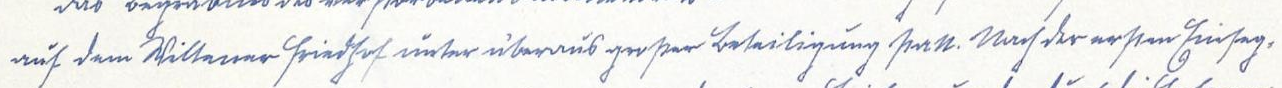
auf dem Wiltener Friedhof unter überaus großer Beteiligung statt. Nach der ersten Einseg-
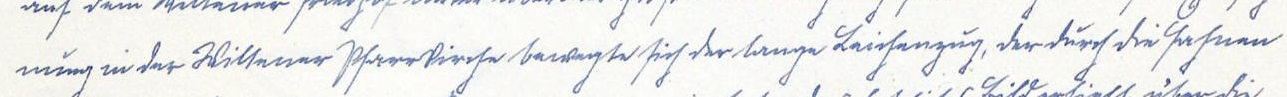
nung in der Wiltener Pfarrkirche bewegte sich der lange Leichenzug, der durch die Fahnen
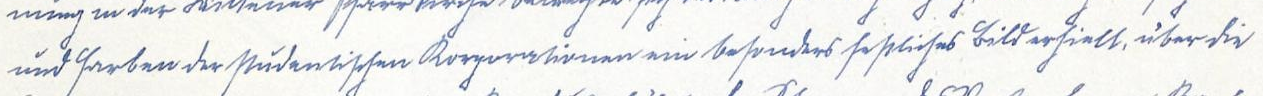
und Farben der studentischen Korporationen ein besonders festliches Bild erhielt, über die
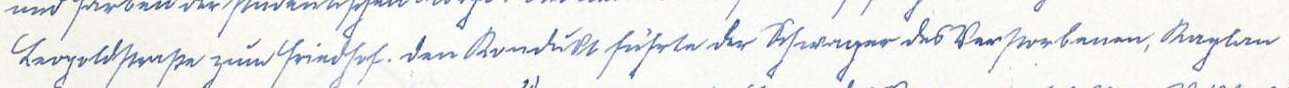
Leopoldstraße zum Friedhof. Den Kondukt führte der Schwager des Verstorbenen, Kaplan
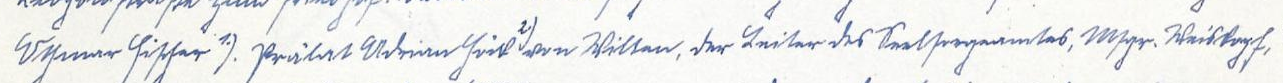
Ottmar Fischer 2). Prälat Adrian Höck (?) 2) von Wilten, der Leiter des Seelsorgeamtes, Msgr. Weiskopf 3)
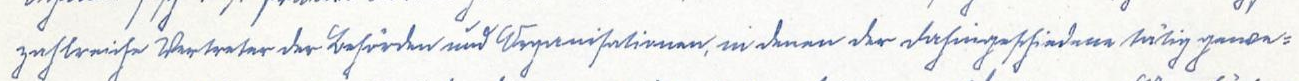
zahlreiche Vertreter der Behörden und Organisationen, in denen der Dahingeschiedene tätig gewe-
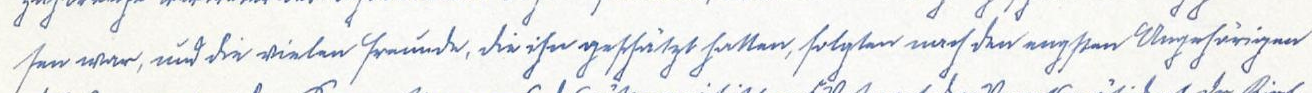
sen war, und die vielen Freunde, die ihn geschätzt hatten, folgten nach den engsten Angehörigen
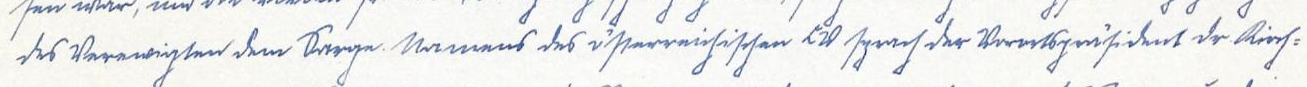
des Verewigten dem Sarge. Namens des österreichischen CV sprach der Vorortspräsident Dr. Kirch-
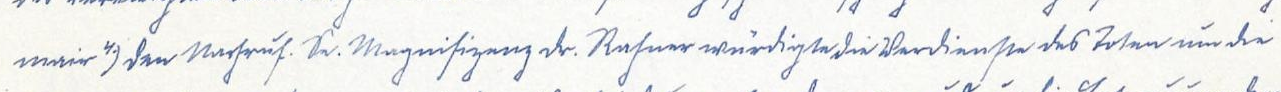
mayr 4) den Nachruf. Se. Magnifizen Dr. Rahner würdigte die Verdienste des Toten um die
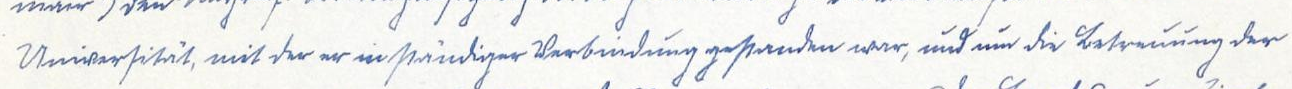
Universität, mit der er in ständiger Verbindung gestanden war, und um die Betreuung der
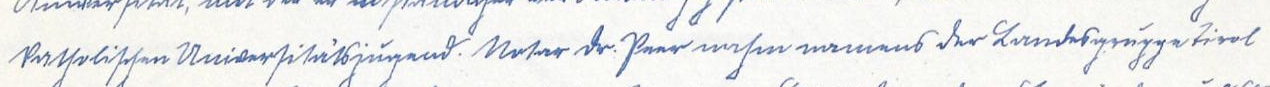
katholischen Universitätsjugend. Notar Dr. Peer nahm namens der Landesgruppe Tirol
